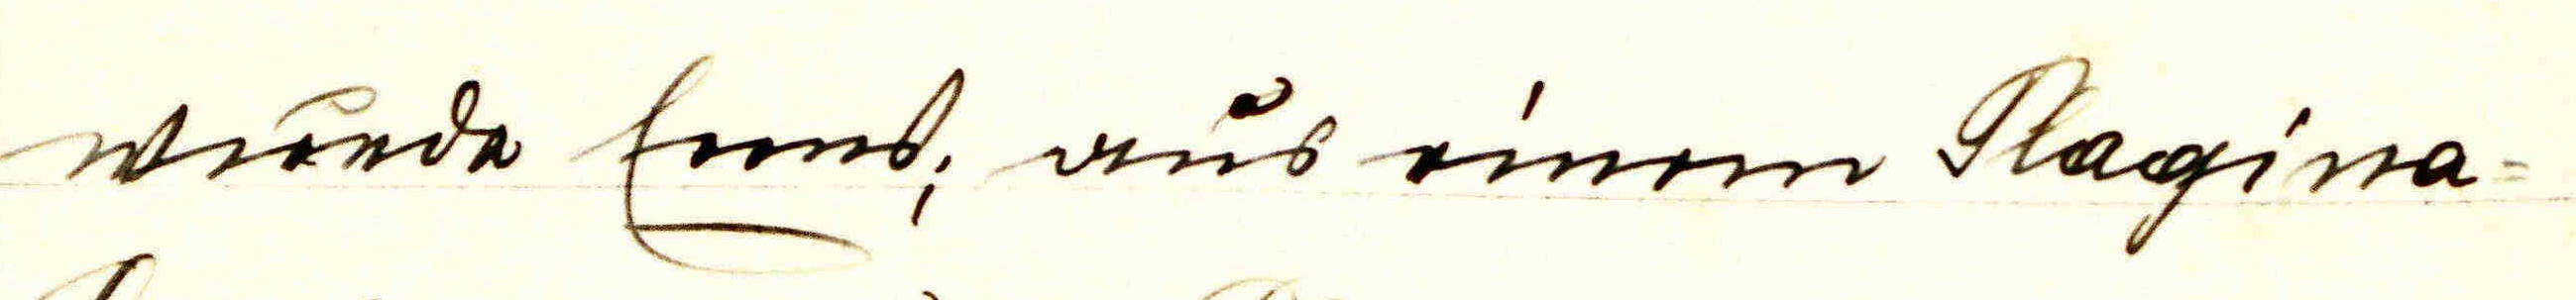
wurde Enns; aus einem Plagina
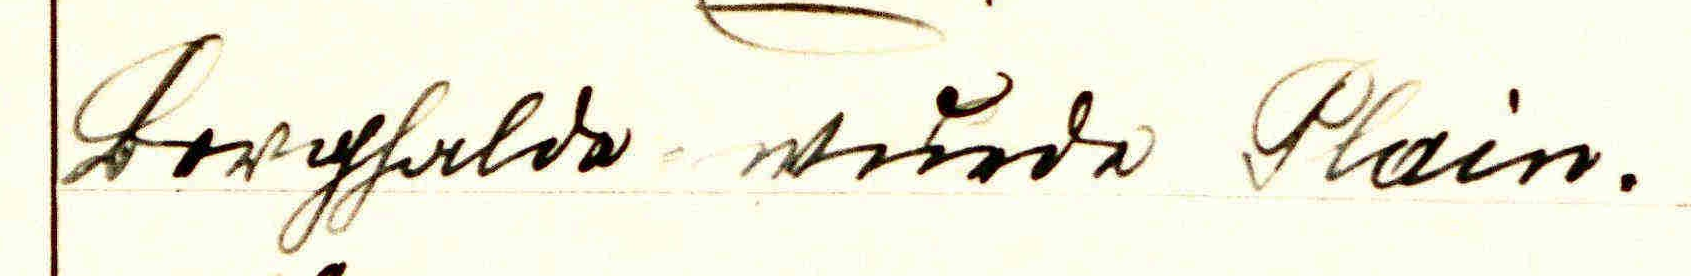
Berghalde wurde Plain.
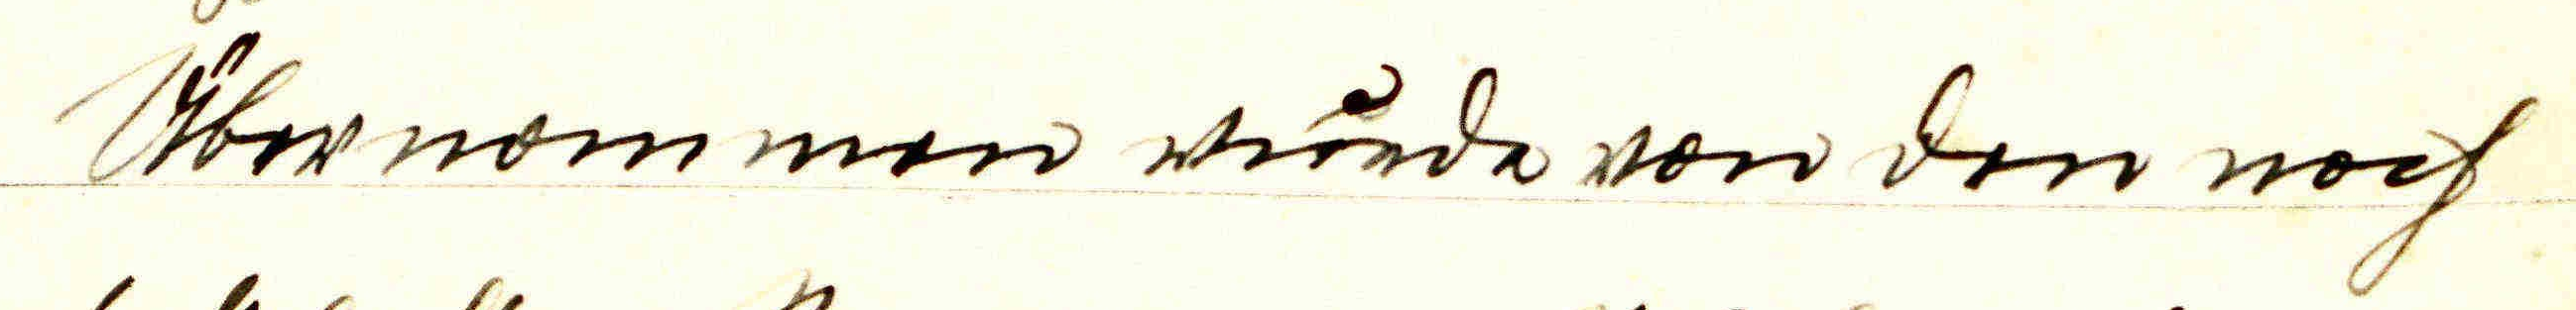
Übernommen wurde von den noch
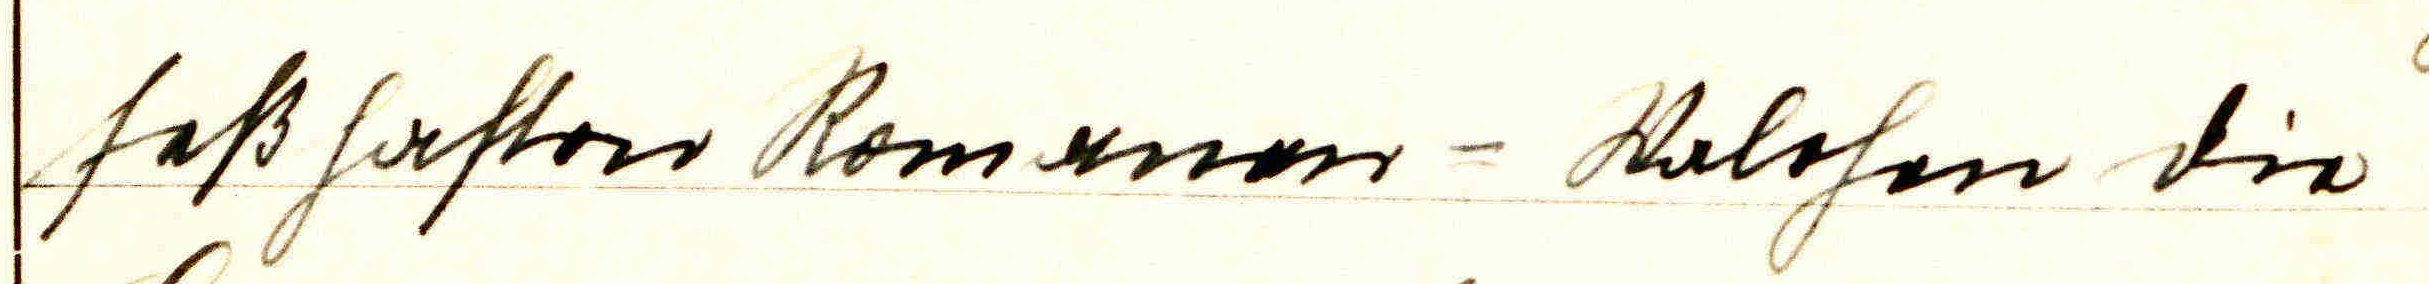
seßhaften Romanen-Walohen die
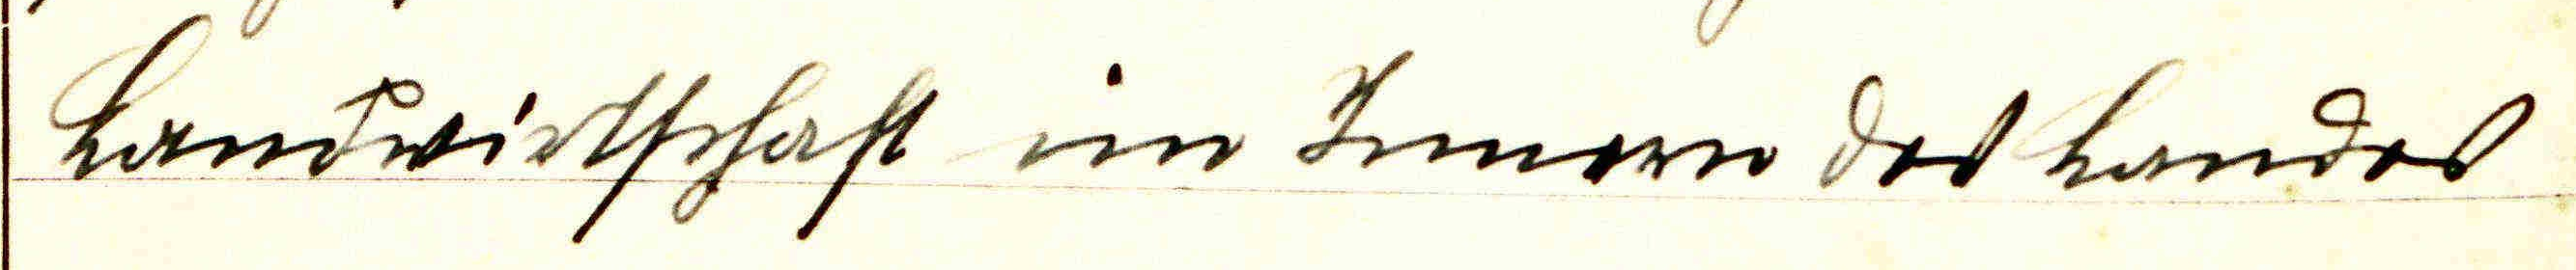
Landwirtschaft im Innern des Landes
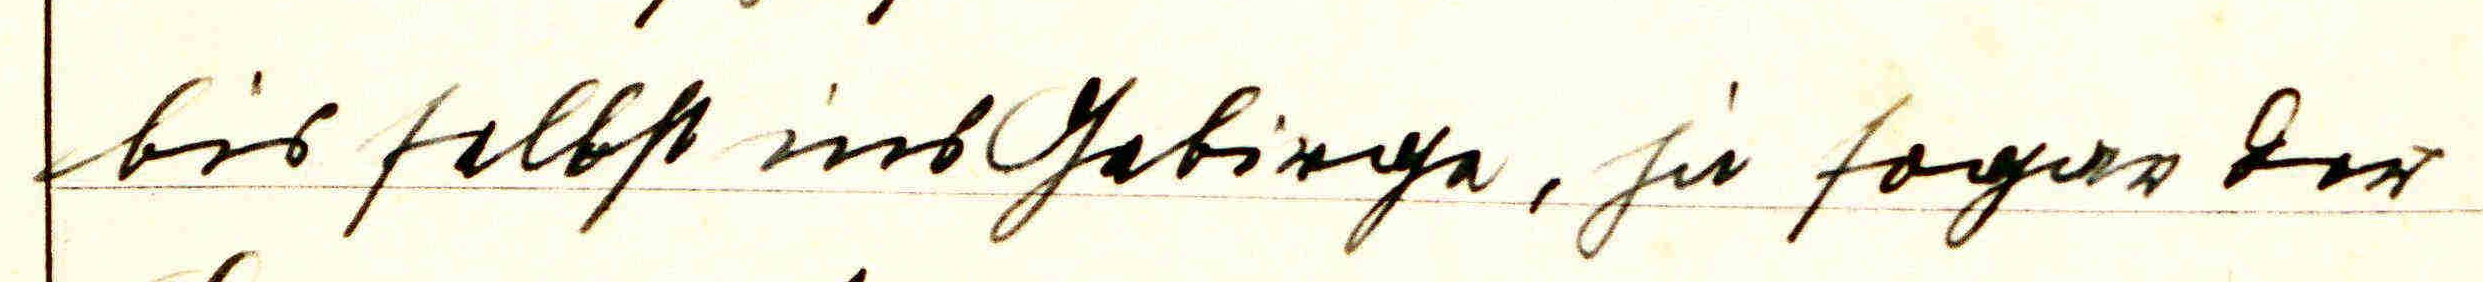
bis selbst ins Gebirge, ja sogar der
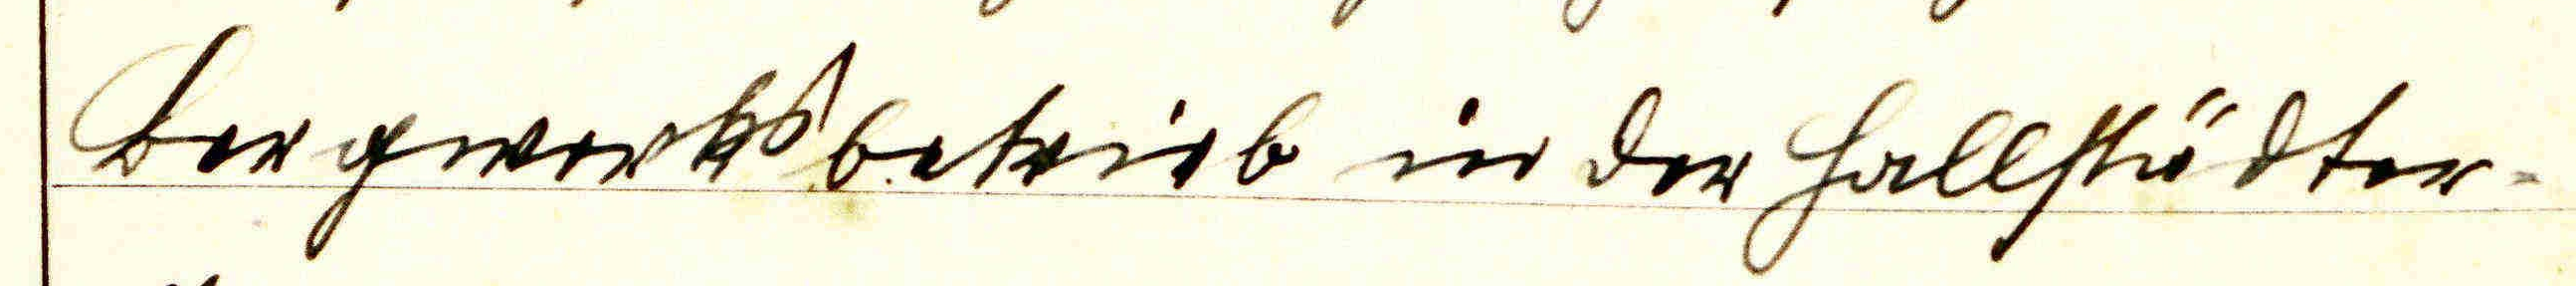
Bergwerksbetrieb in der Hallstädter
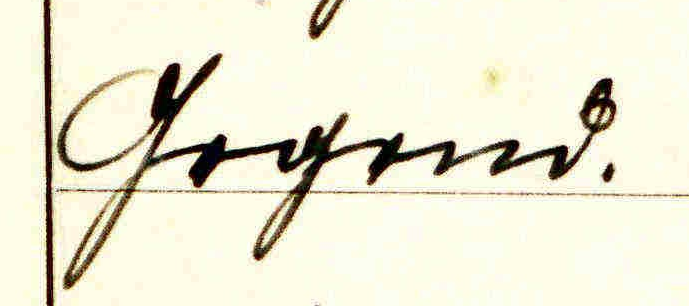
Gegend.
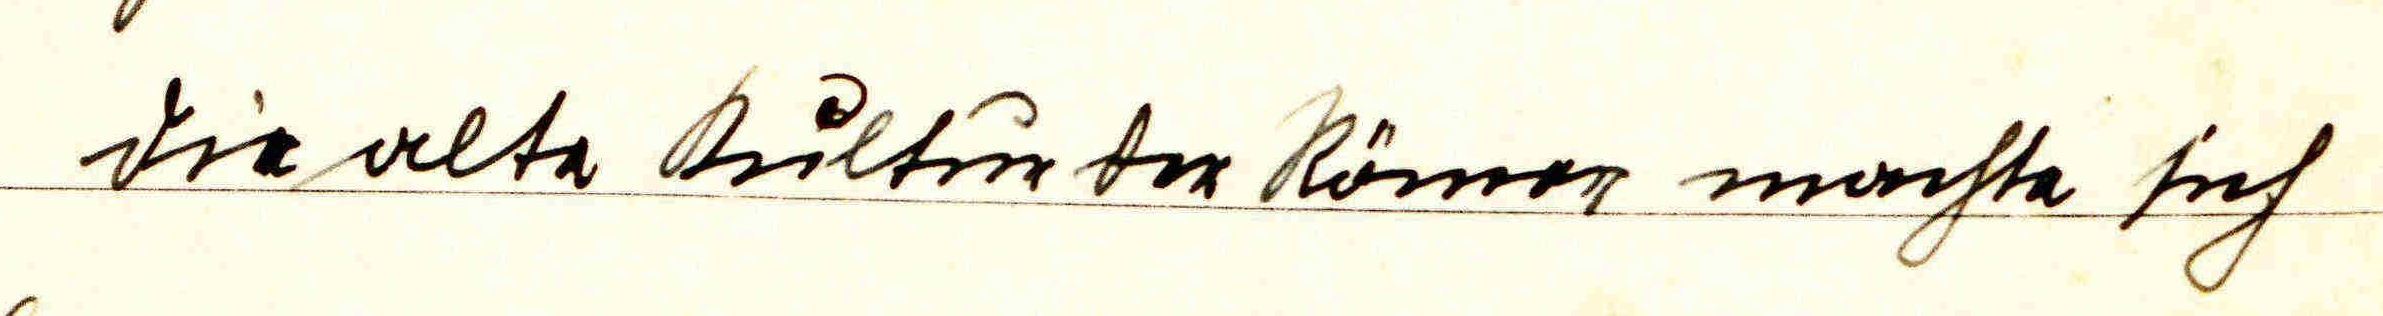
Die alte Kultur der Römer machte sich
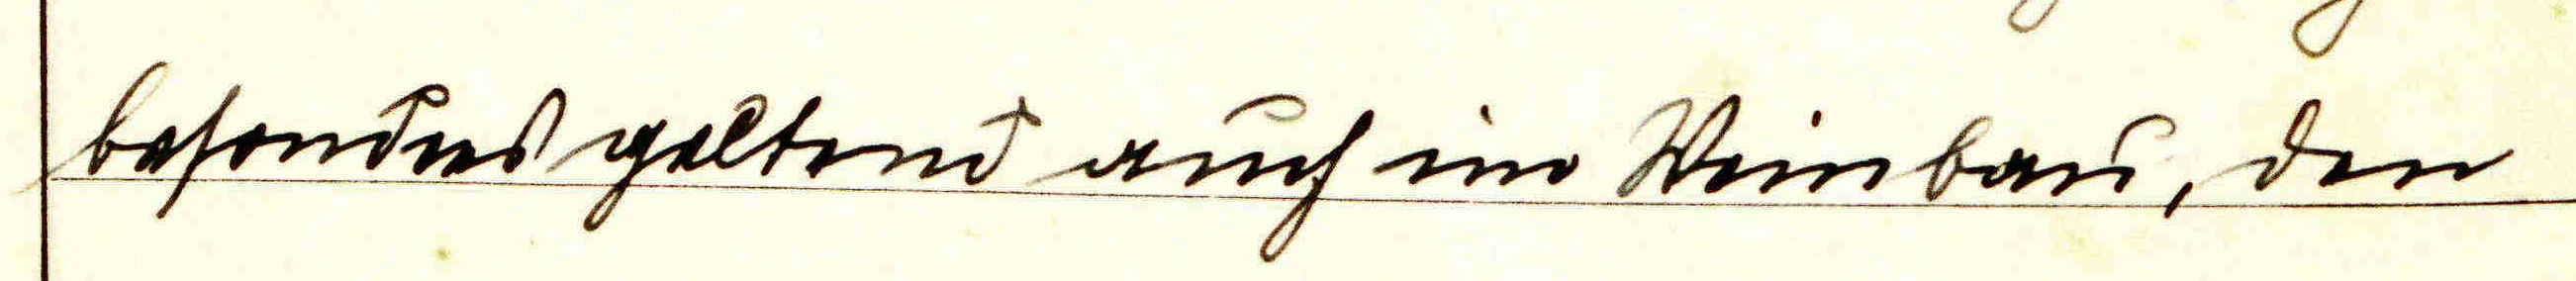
besonders geltend auch im Weinbau, den
